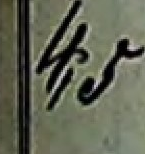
4,5
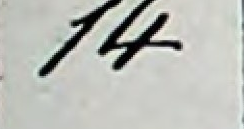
14
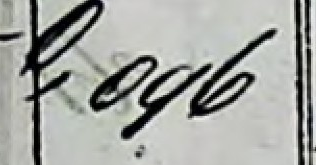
0,096
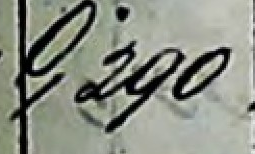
0,290
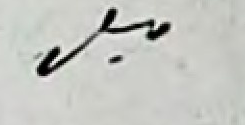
do
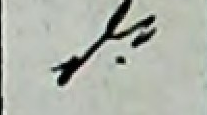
do
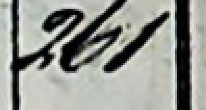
261
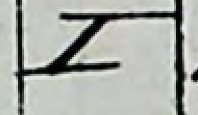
I
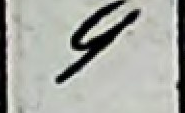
9
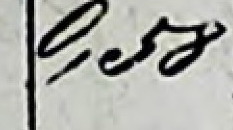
0,58
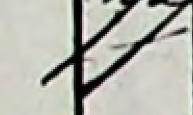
77
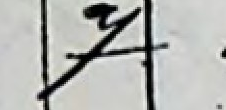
7
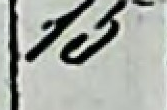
15
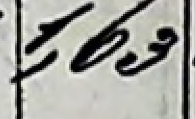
1,63
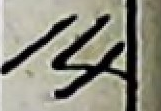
14
